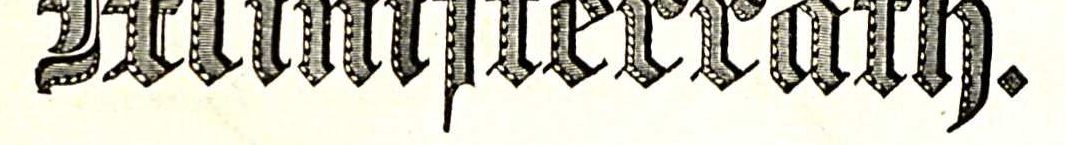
Ministerrath
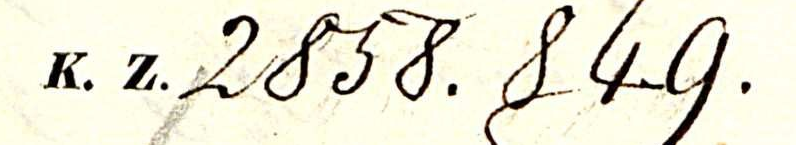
KZ 2858.849
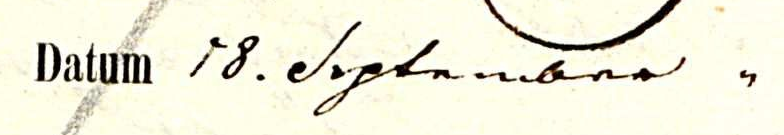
Datum 18. Septbr “
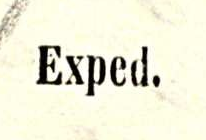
Exped.
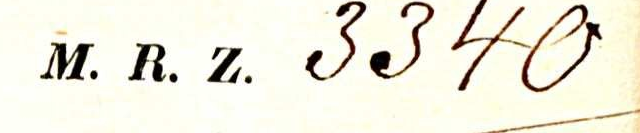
MRZ 3340
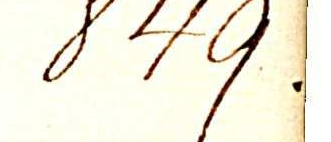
849
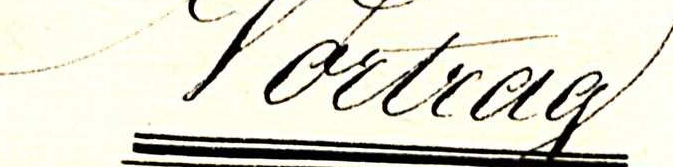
Vortrag
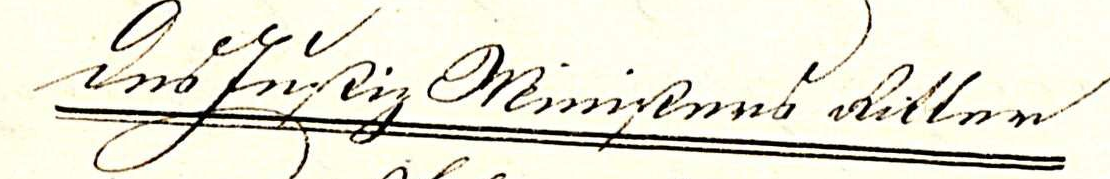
des Justiz Ministers Ritter
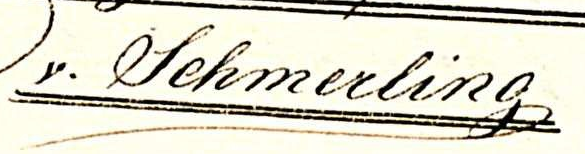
v. Schmerling
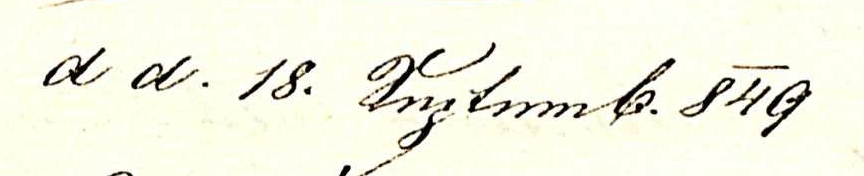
dd 18. Septemb. 849
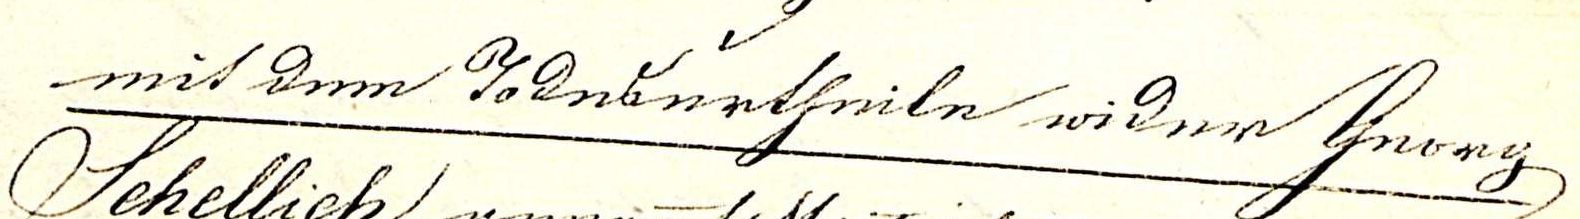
mit dem Todesurtheile wider Georg
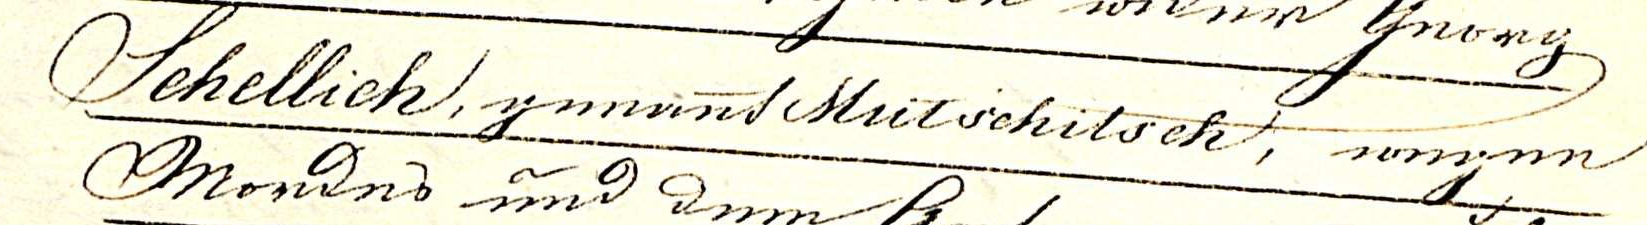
Schellich, genannt Mutschitsch, wegen
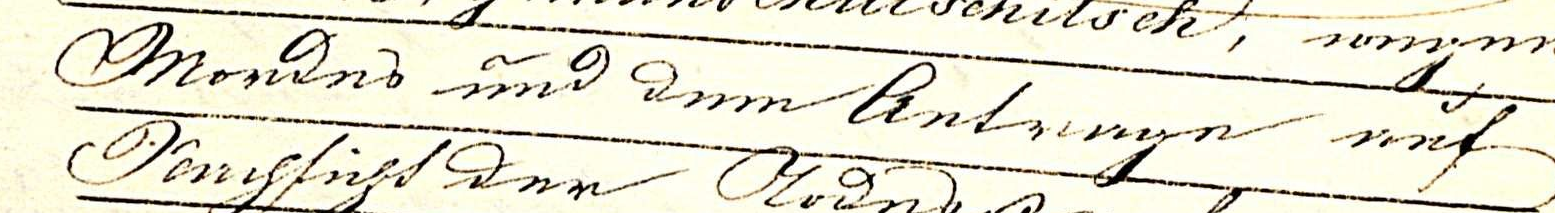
Mordes und dem Antrage auf
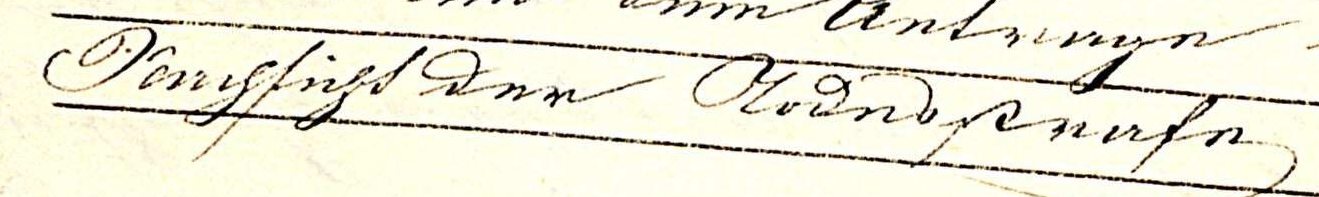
Nachsicht der Todesstrafe
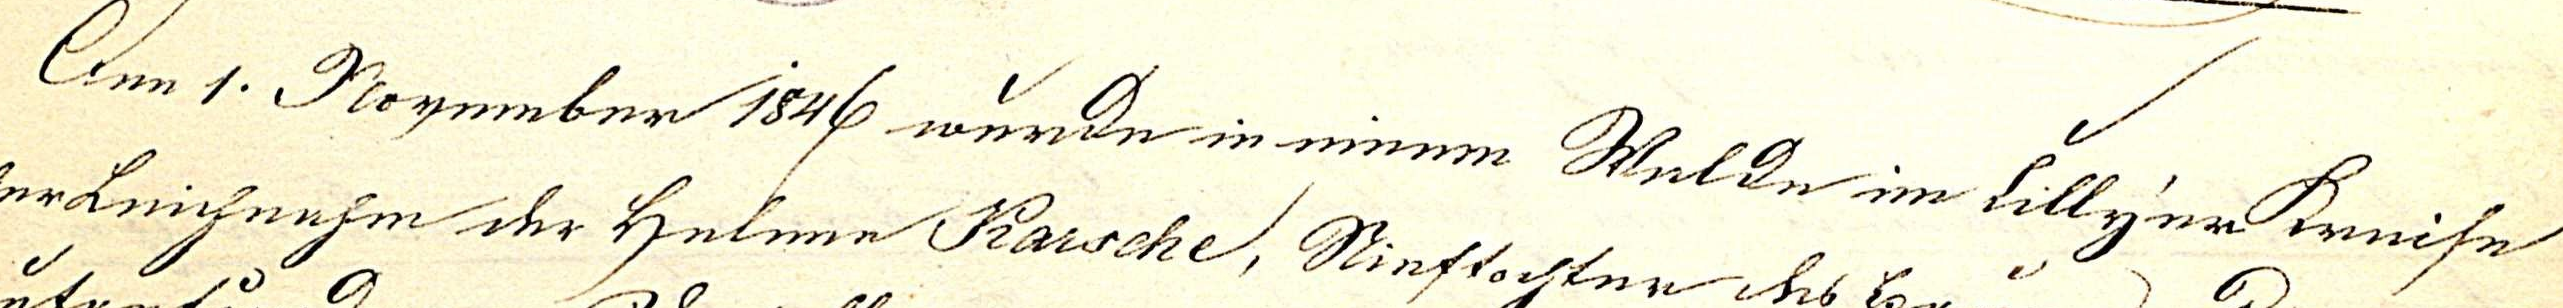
Den 1. November 846 wurde in einem Walde im Cilly’er Kreise
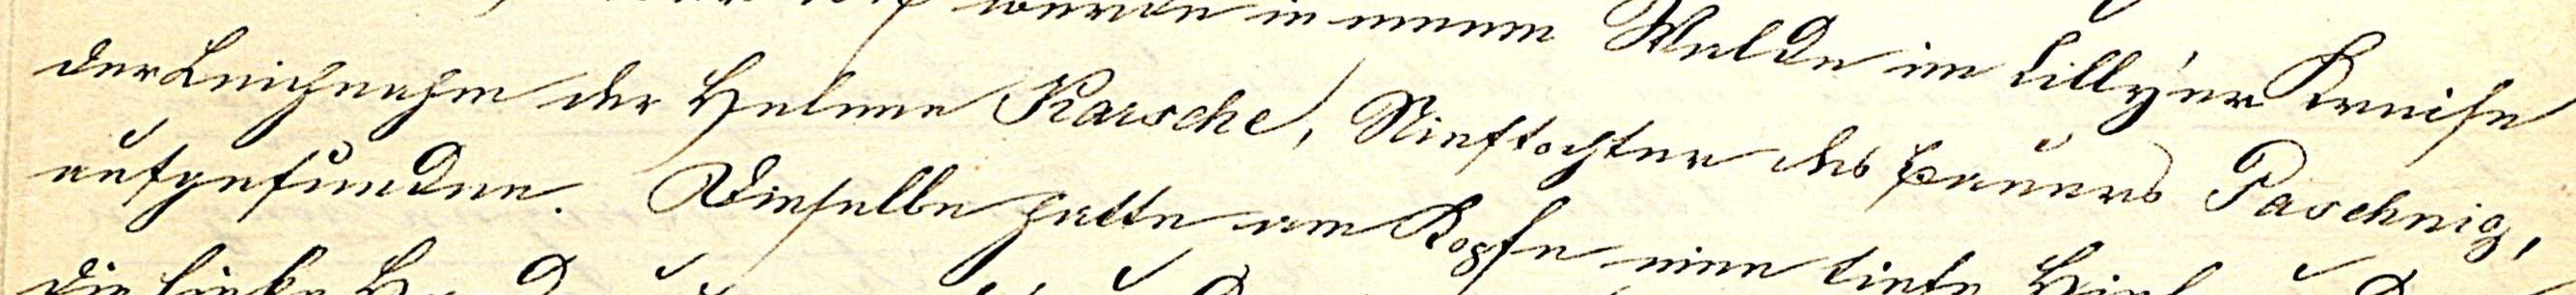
der Leichnahm der Helene Karsche, Stieftochter des Bauers Paschnig,
